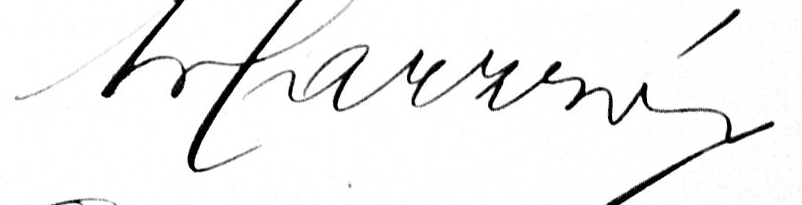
xx
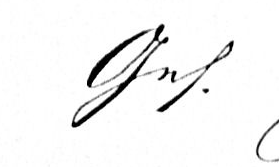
Ges.
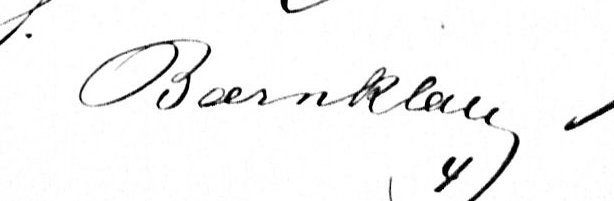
Barnklau
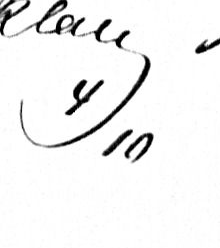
4/10
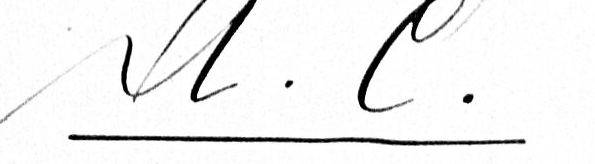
A. E.
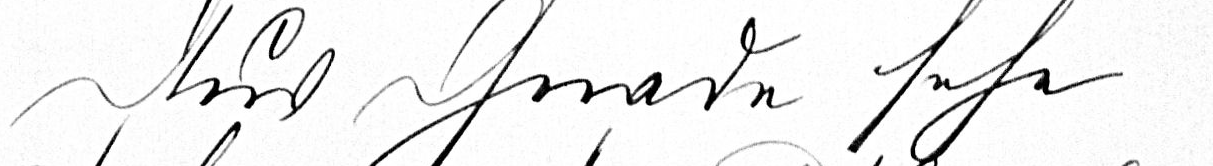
Aus Gnade sehe
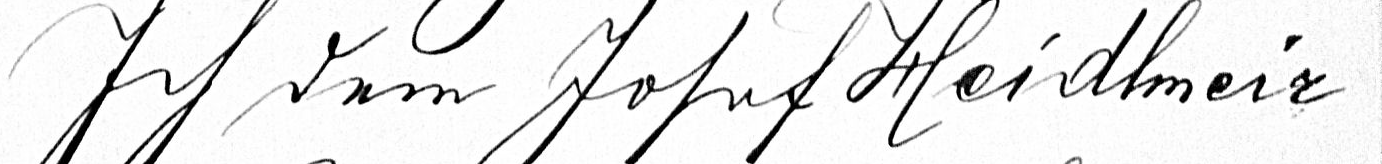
Ich dem Josef Heidlmeir
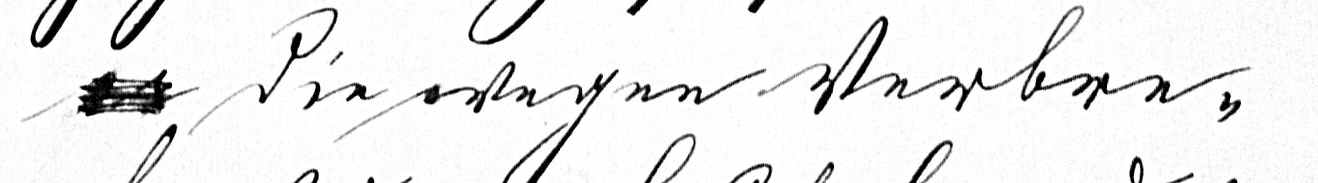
die wegen Verbre¬
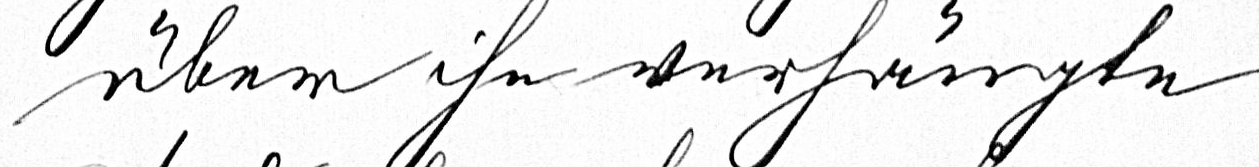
über ihn verhängte
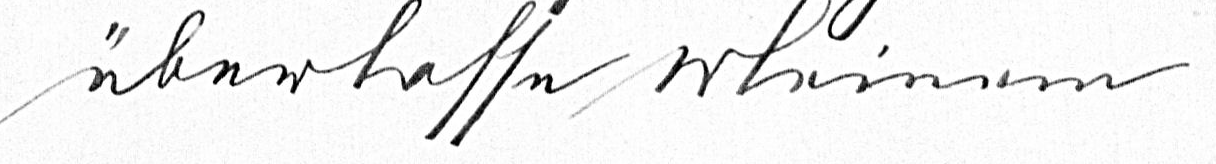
überlasse Meinem
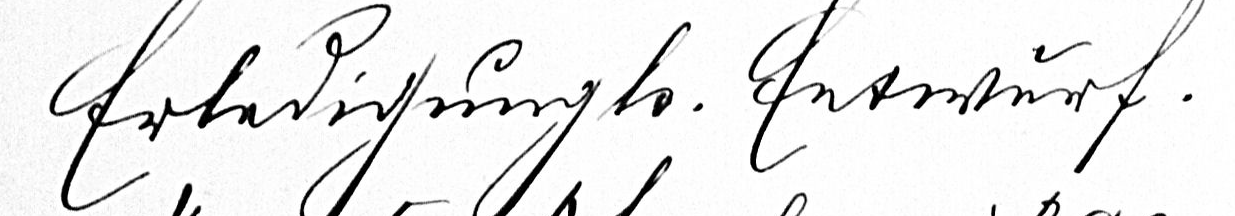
Erledigung xx Entwurf.
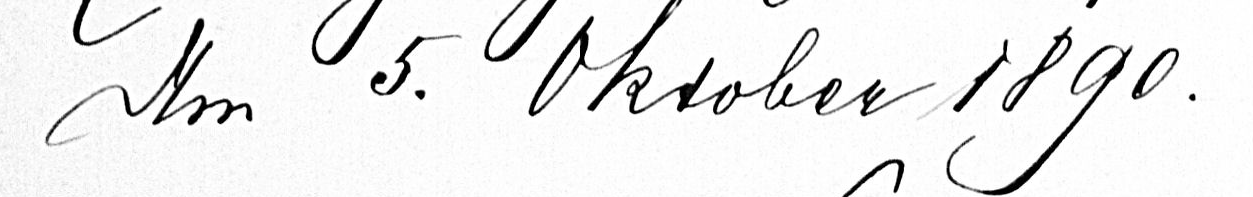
Am 5. Oktober 1890.
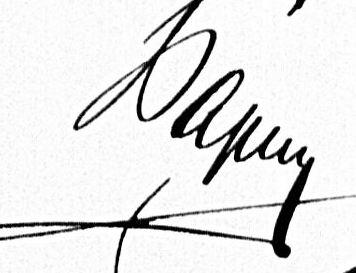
xx
